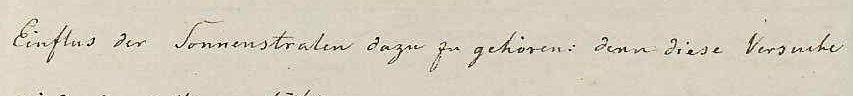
Einflus der Sonnenstralen dazu zu gehören: denn diese Versuche
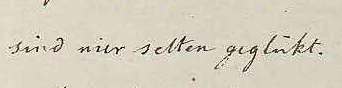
sind nur selten geglükt.
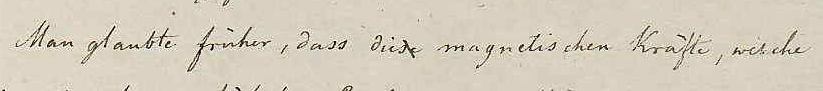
Man glaubte früher, dass diese magnetischen Kräfte, welche
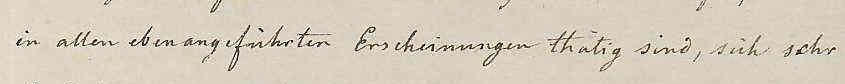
in allen eben angeführten Erscheinungen thätig sind, sich sehr
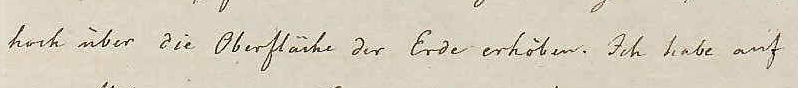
hoch über die Oberfläche der Erde erhöhen. Ich habe auf
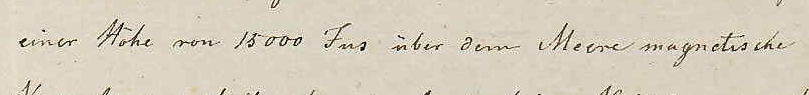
einer Höhe von 15000 Fus über dem Meere magnetische
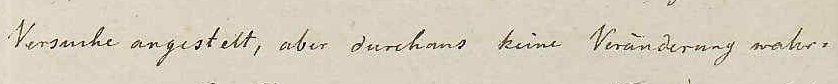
Versuche angestelt, aber durchaus keine Veränderung wahr-
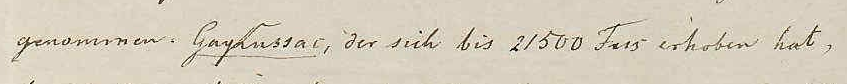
genommen. Gay Lussac, der sich bis 21500 Fus erhoben hat,
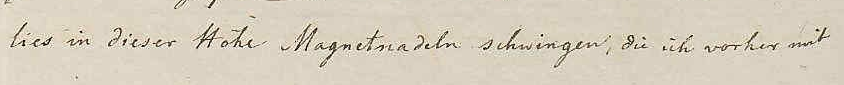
lies in dieser Höhe Magnetnadeln schwingen, die ich vorher mit
